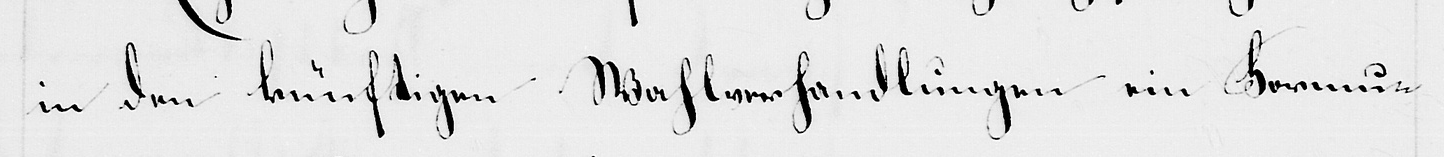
in den künftigen Wahlverhandlungen ein Formu¬
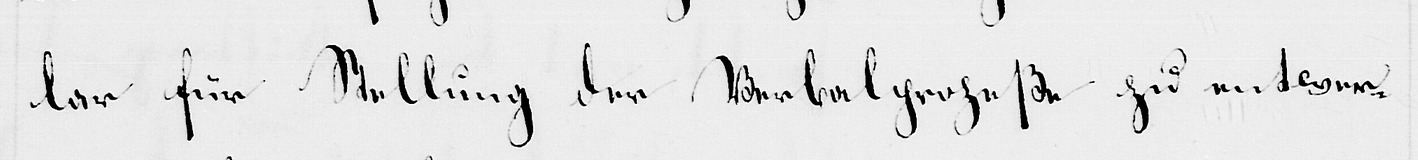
lar für Stellung der Verbalprozeße zu entwer¬
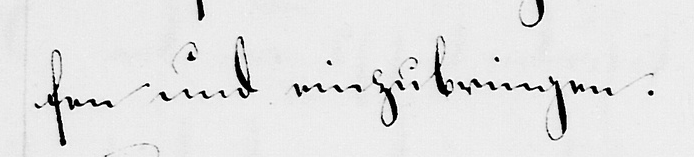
fen und einzubringen.
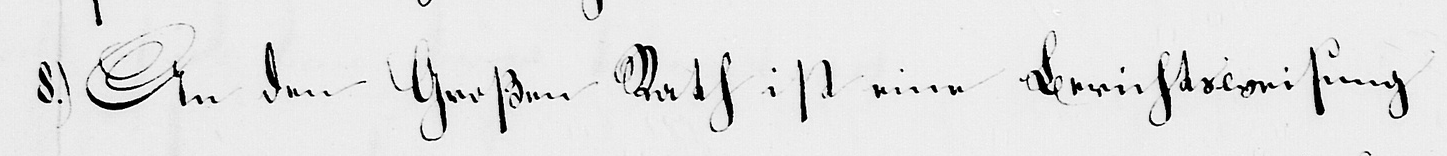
8.) An den Großen Rath ist eine Berichtsweisung
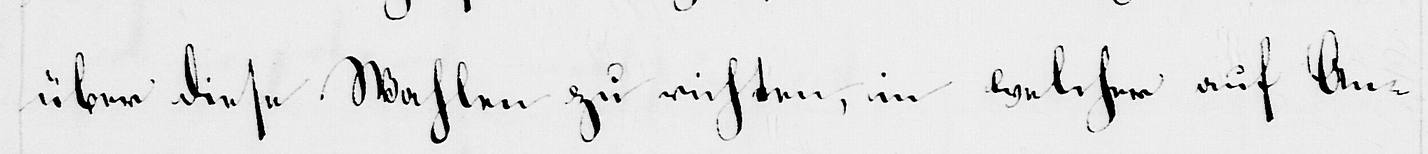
über diese Wahlen zu richten, in welcher auf An¬
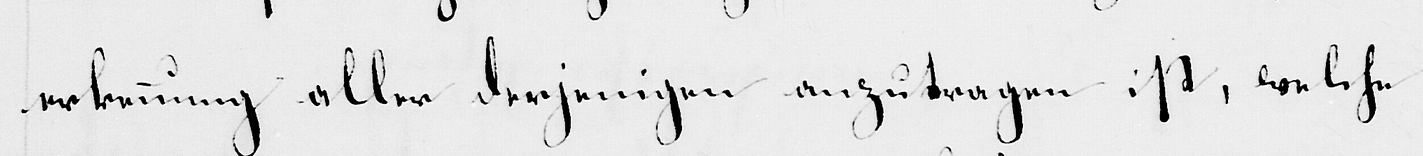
erkennung aller derjenigen anzutragen ist, welche
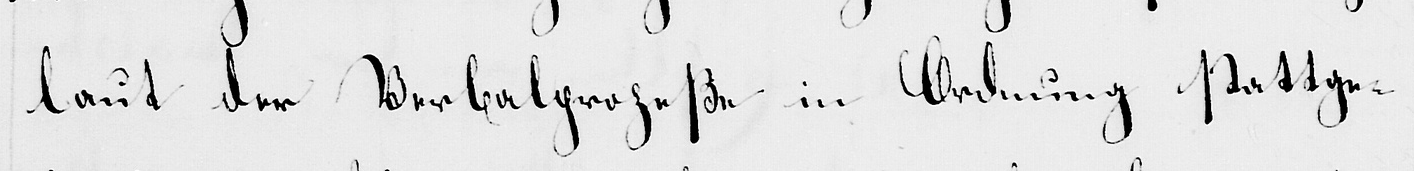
laut der Verbalprozeße in Ordnung stattge¬
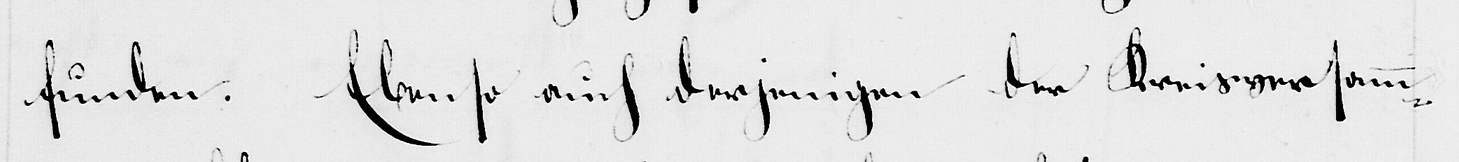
funden. Ebenso auch derjenigen der Kreisversamm¬
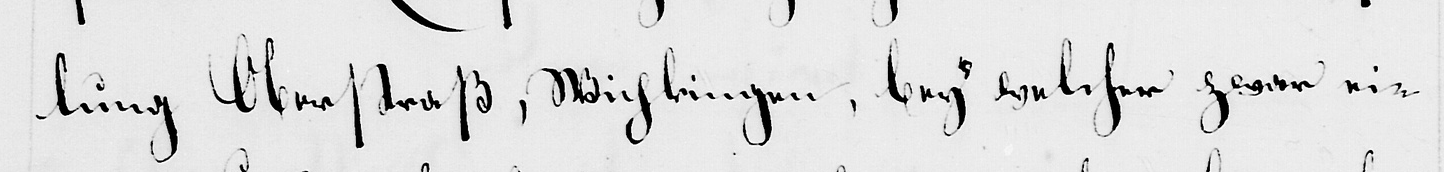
lung Oberstraß, Wipkingen, bey welchen zwar ei¬
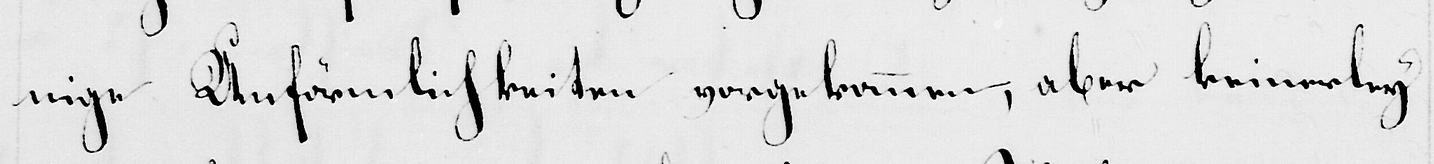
nige Unförmlichkeiten vorgekommen, aber keinerley
